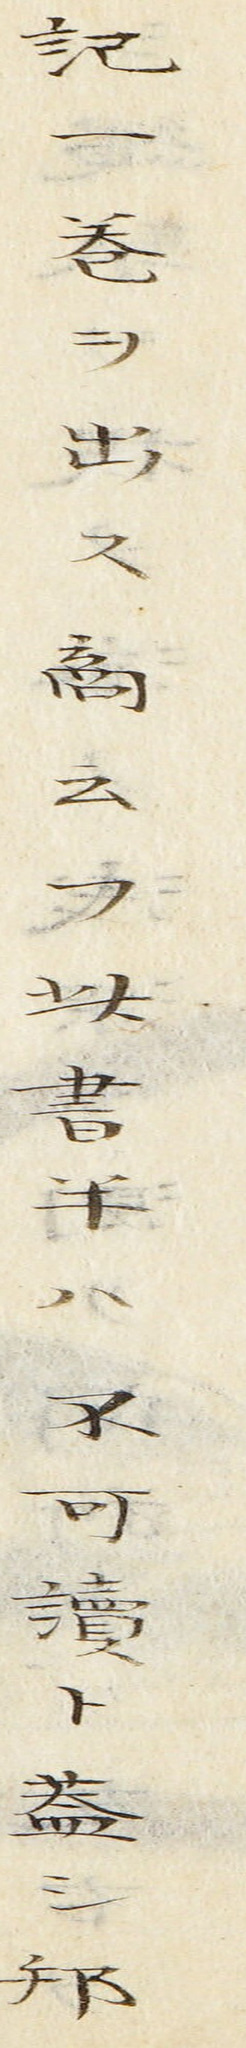記一巻ヲ出ス商云フ此書半ハ不可読ト蓋シ邦
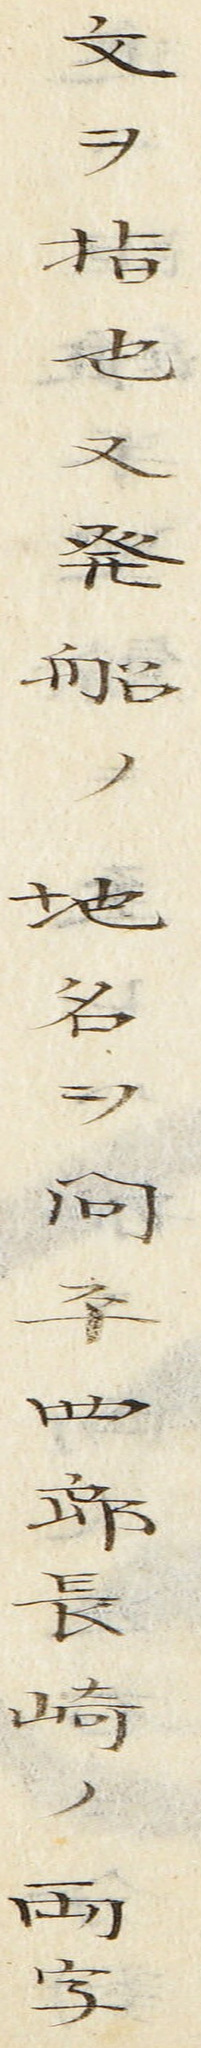文ヲ指也又発船ノ地名ヲ問平四郎長長崎ノ両字
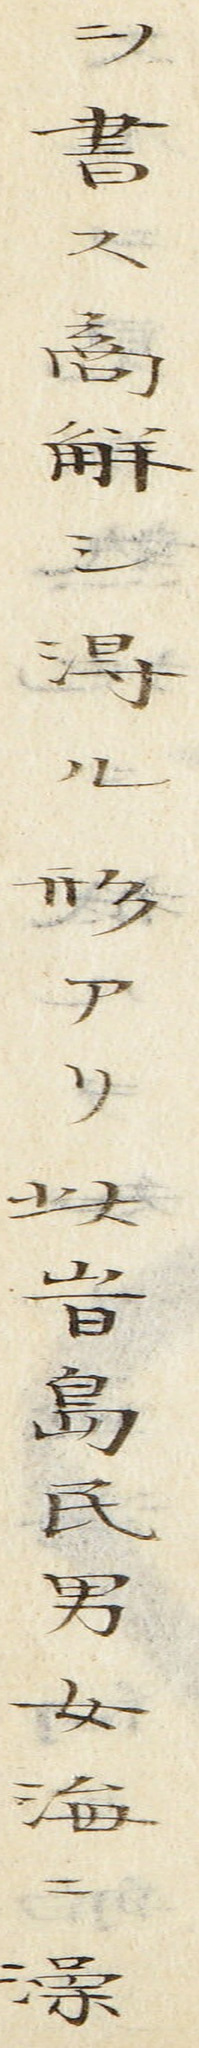ヲ書ス商解シ得ル形アリ此時島民男女海ニ澡

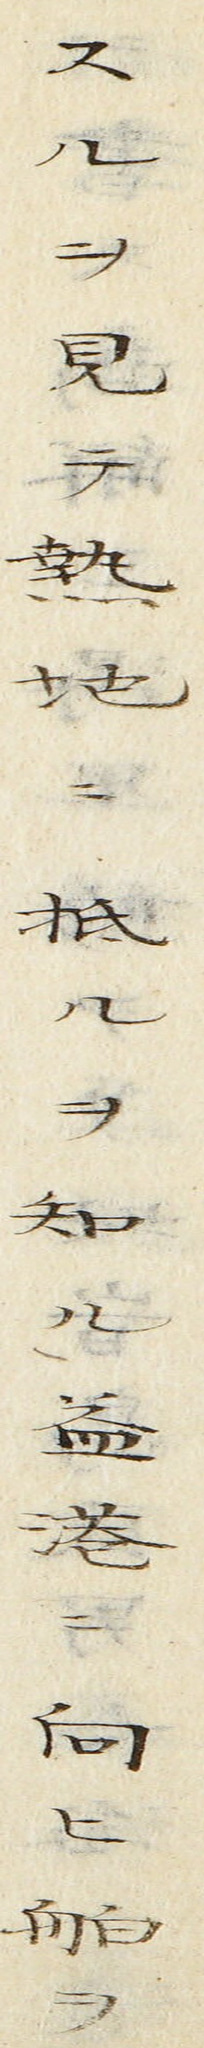スルヲ見テ熱地ニ抵ルヲ知ル益港ニ向ヒ舶ヲ
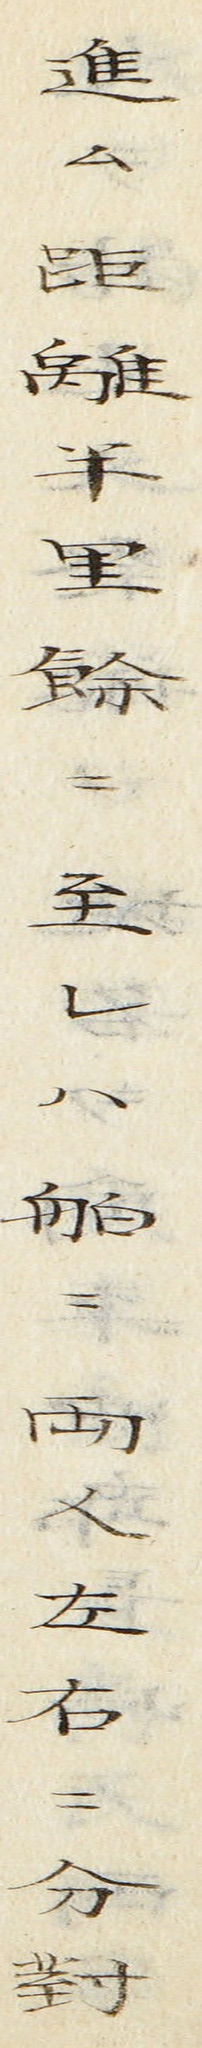進ム距離半里余ニ至レハ舶ニ両人左右ニ分対
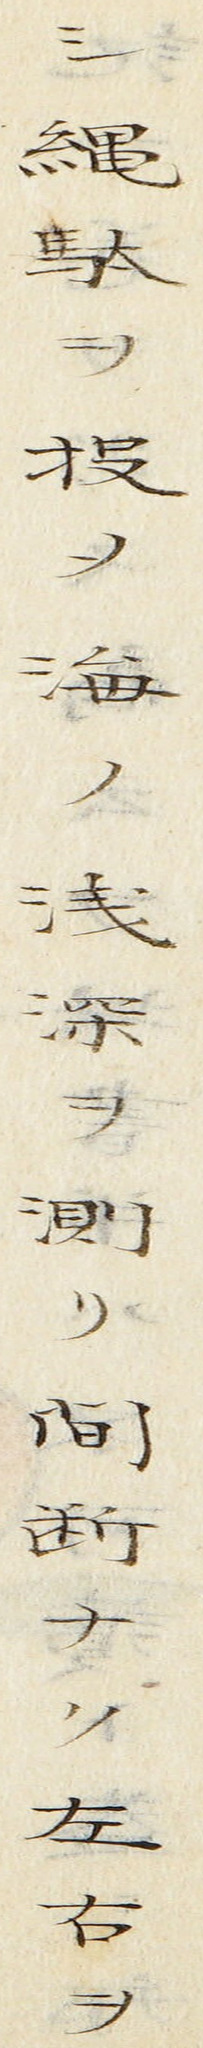シ縄駄ヲ投シテ海ノ浅深ヲ測リ間断ナリ左右ヲ
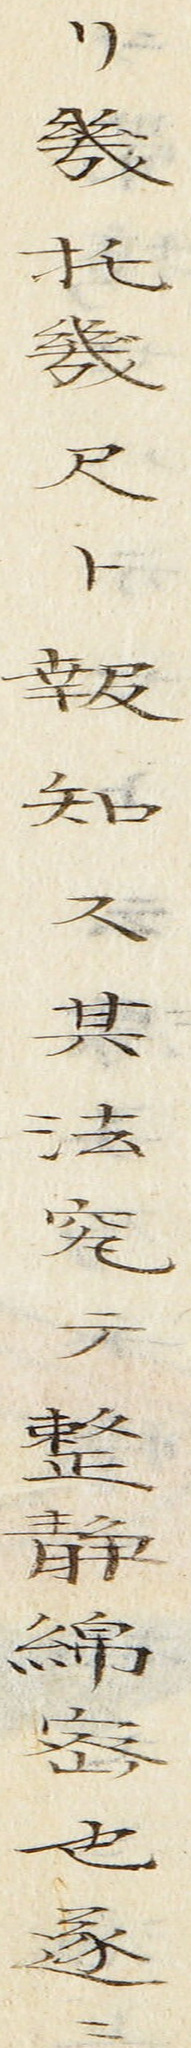リ幾托幾尺ト報知ス其法究テ整静綿密也遂ニ
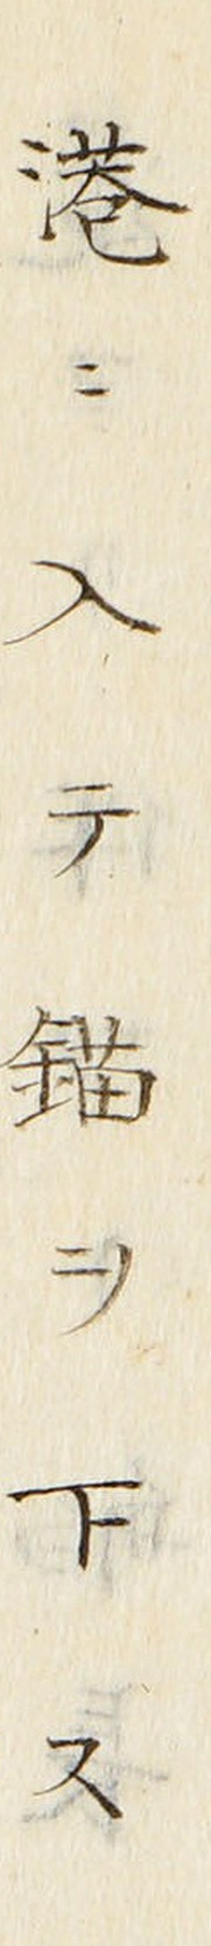港ニ入テ錨ヲ下ス
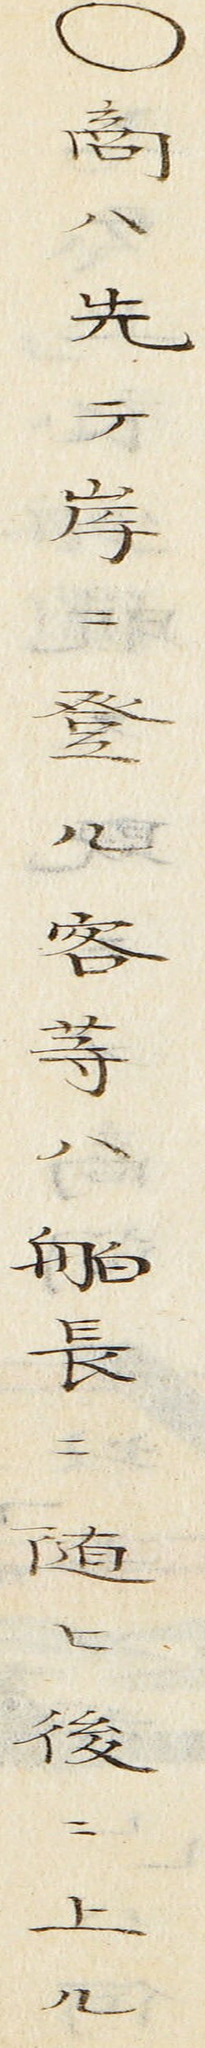○商ハ先テ岸ニ登ル客等ハ舶長ニ随ヒ後ニ上ル
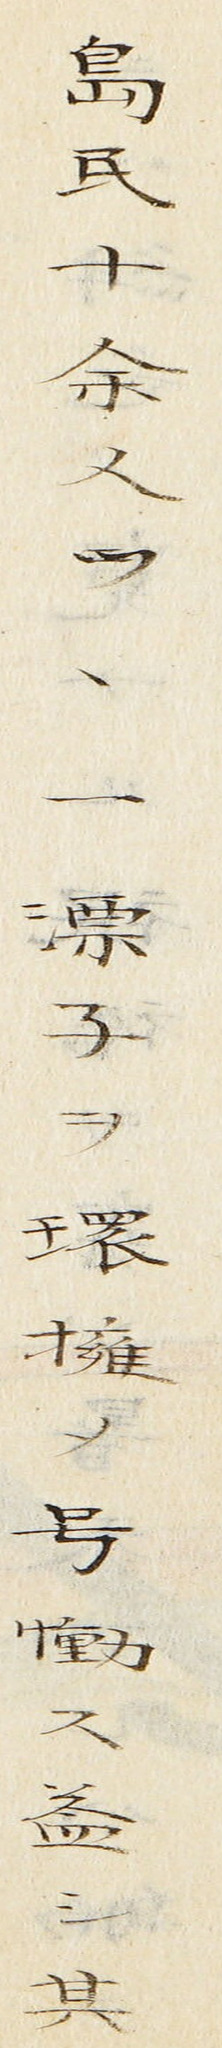島民十余人ツヽ一漂子ヲ環擁シテ号慟ス蓋シ其
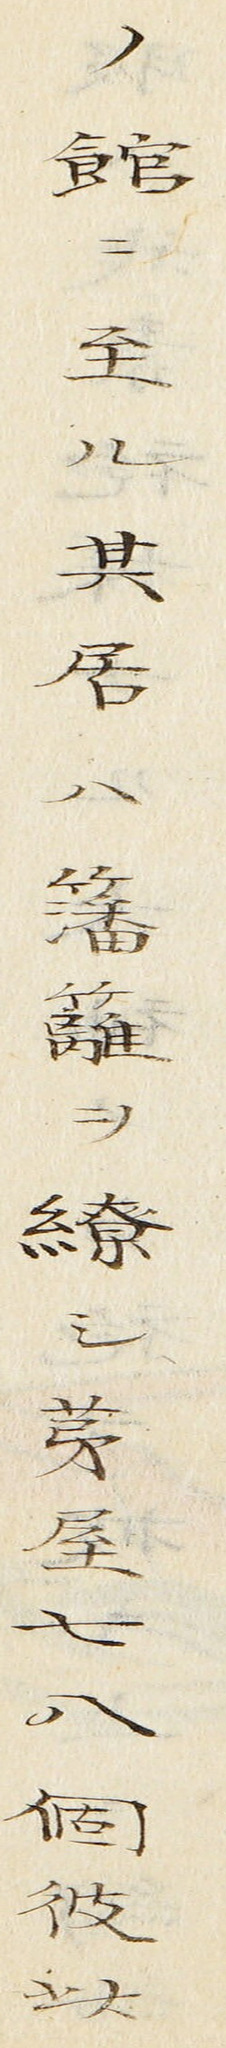ノ館ニ至ル其居ハ籓籬ヲ繚シ茅屋七八個彼此
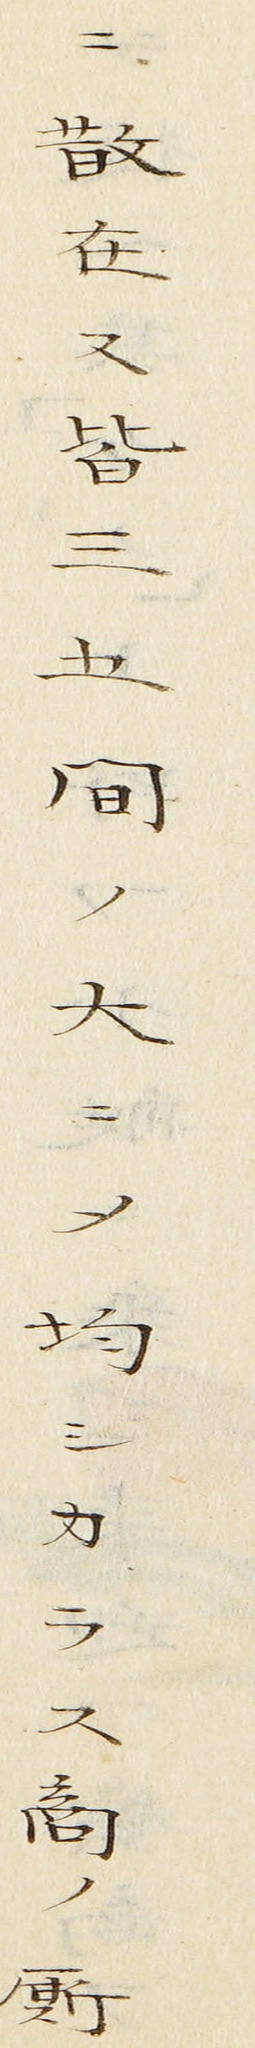ニ散在ス皆三五間ノ大ニシテ均シカラス商ノ厮
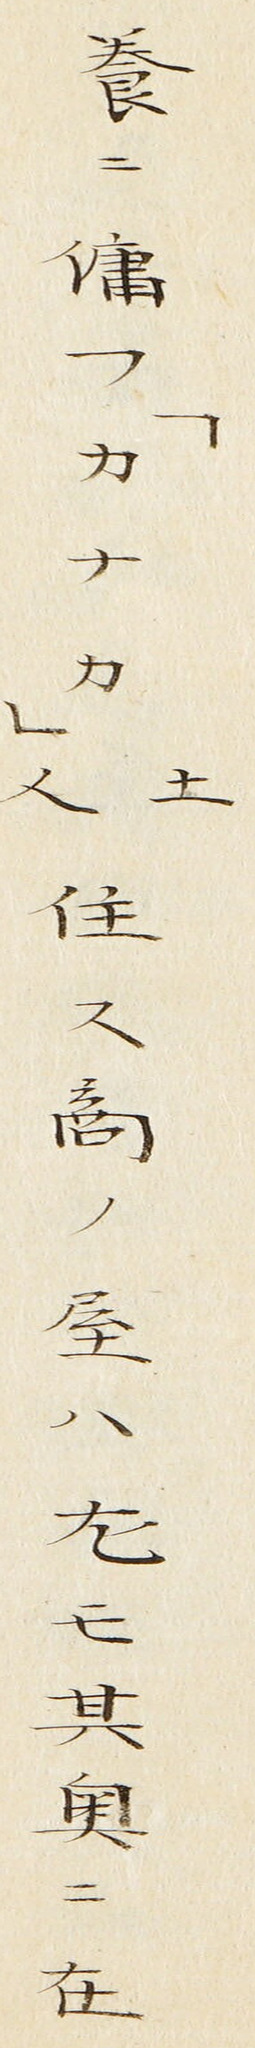養ニ傭フ「カナカ」土人住ス商ノ屋ハ尤モ其奥ニ在
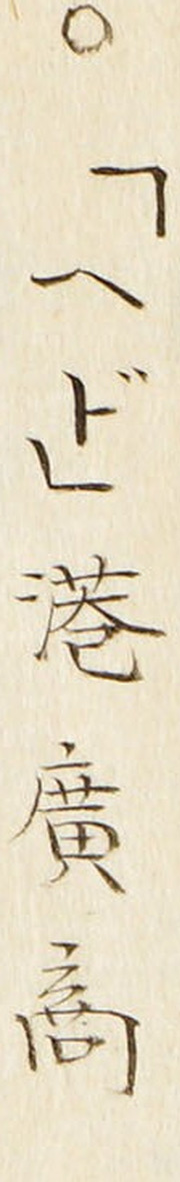◦「ヘド」港広商
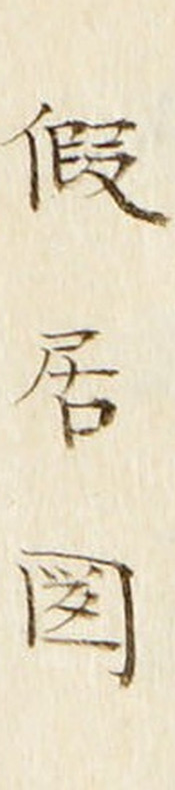仮居図

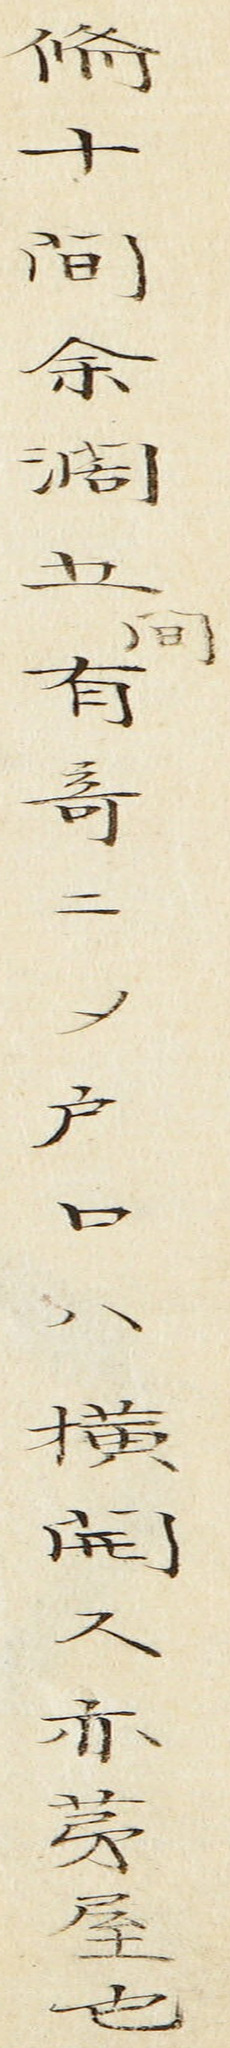修十間余濶五間有奇ニシテ戸口ハ横開ス亦茅屋也
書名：蕃談
